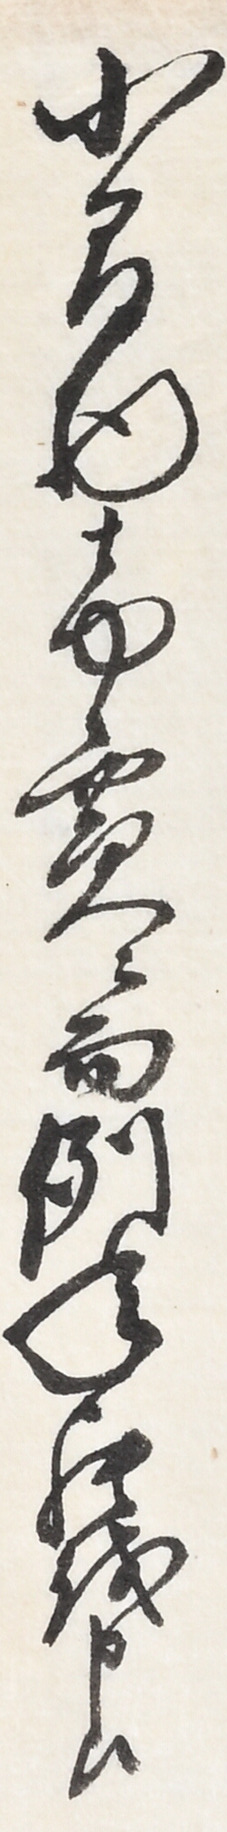小間物商売ニ而例年罷越申候
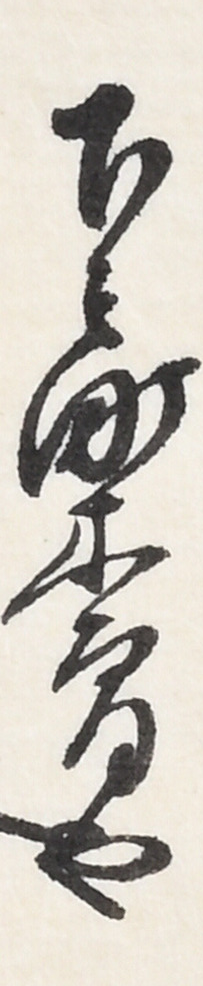下モ町木曾や
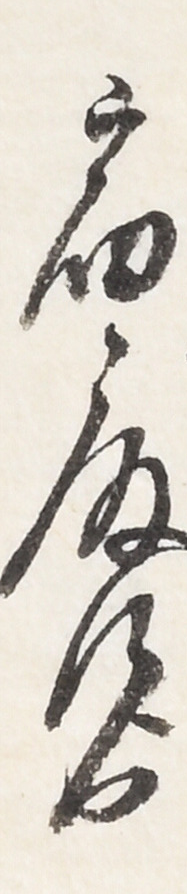宿藤左衛門
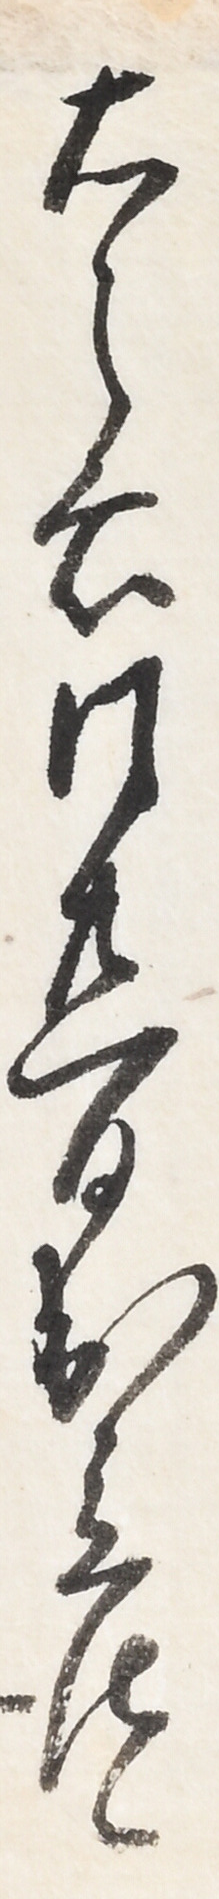右之者同廿一日出立仕候
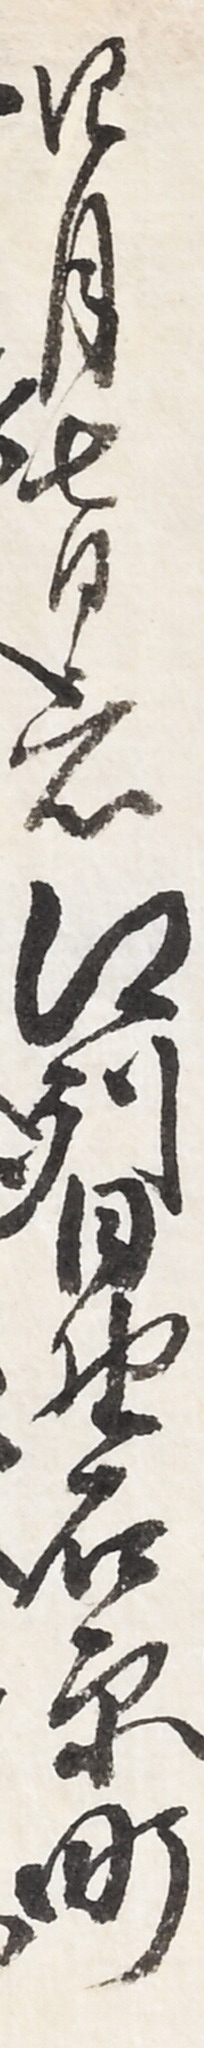四月七日着江州日野石原町
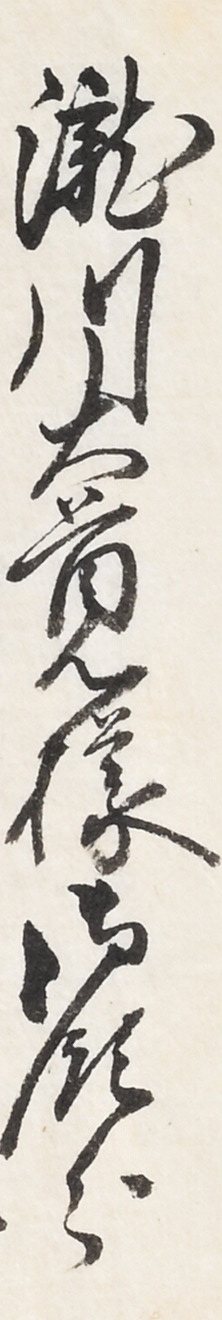瀧川大覚様御領分
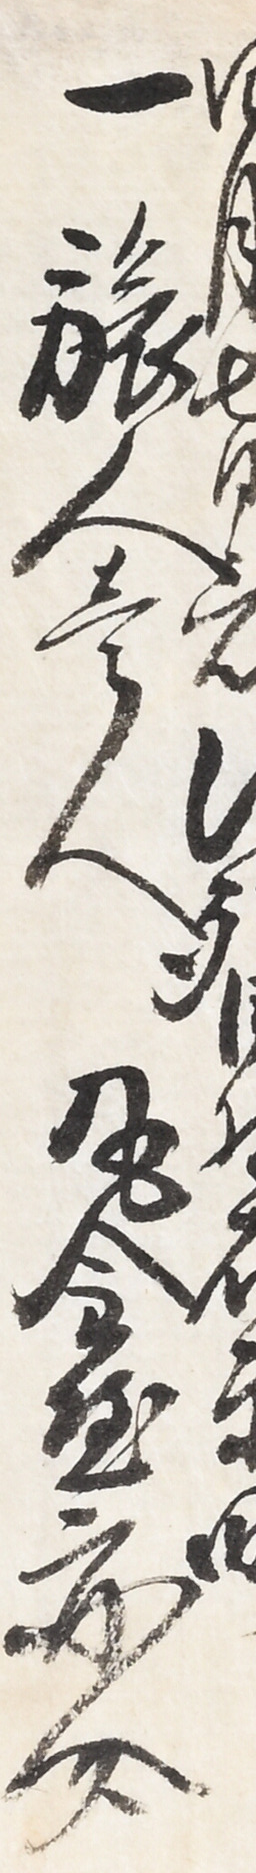一旅人壱人丸金屋亦介
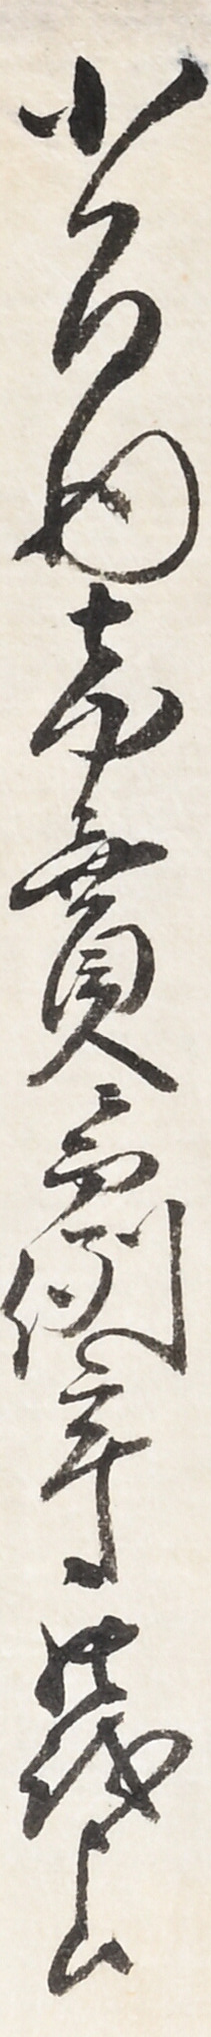小間物商売ニ而例年罷越申候
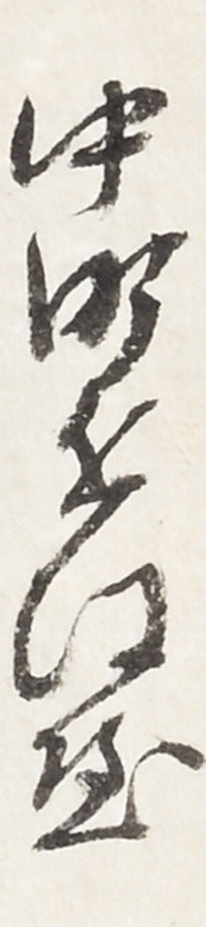中町近江屋
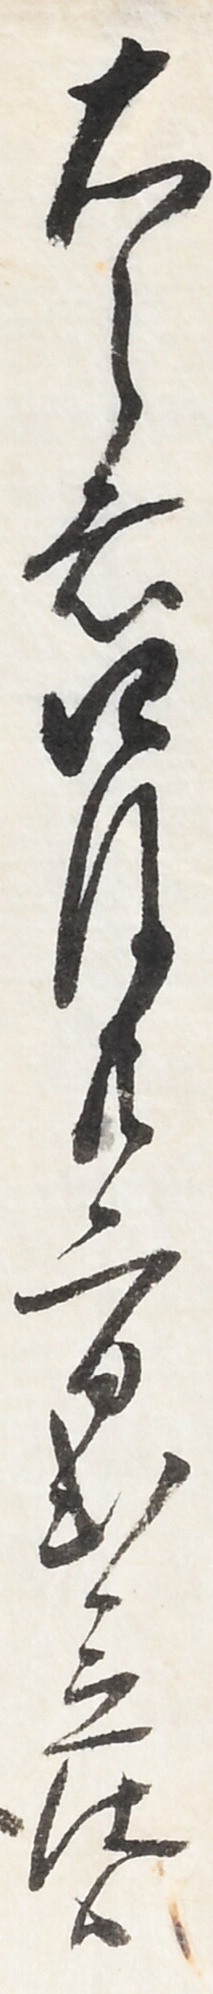右之者四月廿二日出立仕候
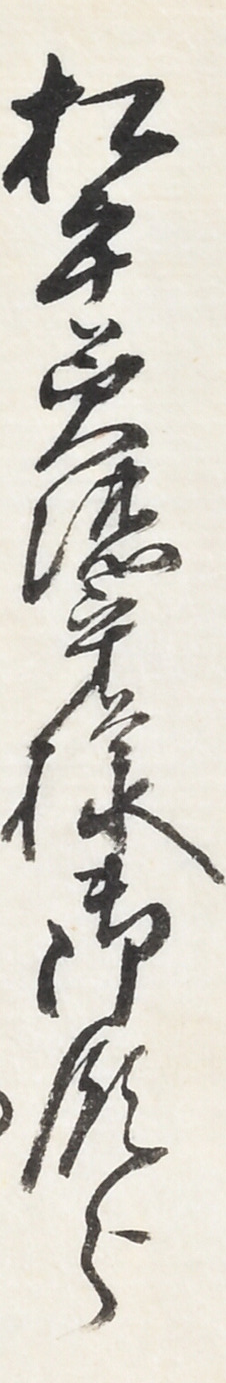松平美濃守様御領分
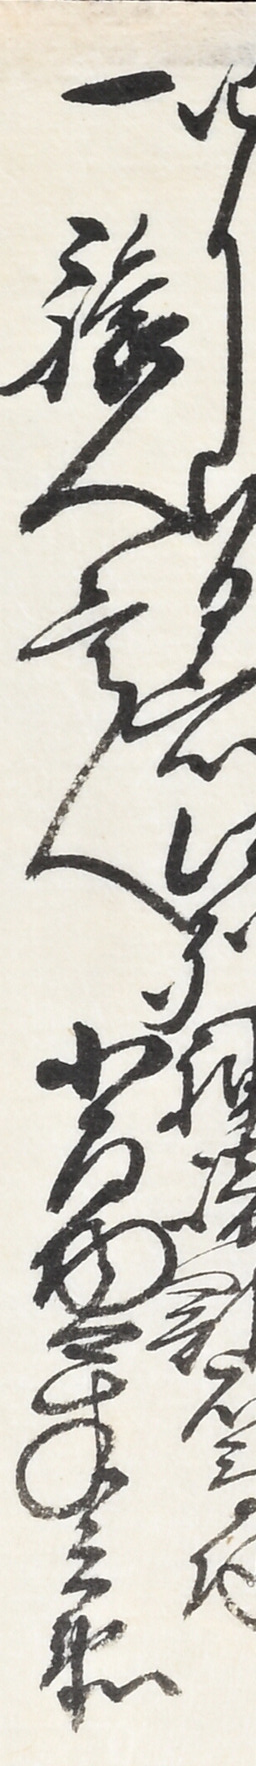一旅人壱人小間物や角兵衛
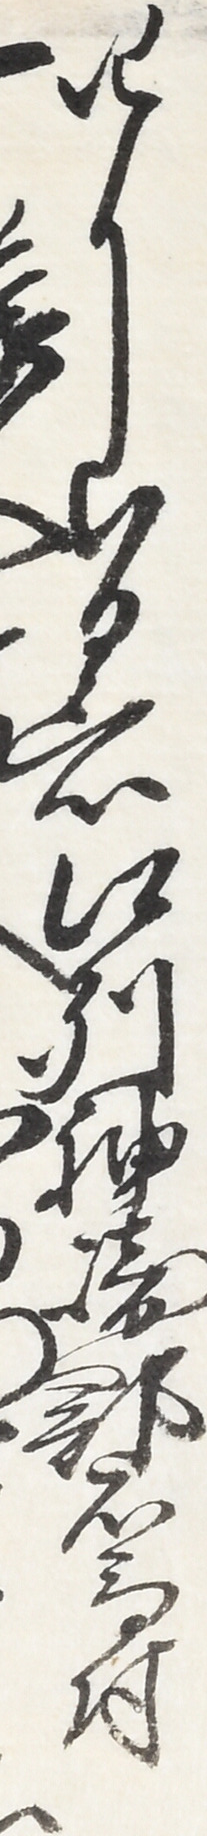四月八日着江州神崎郡石馬村
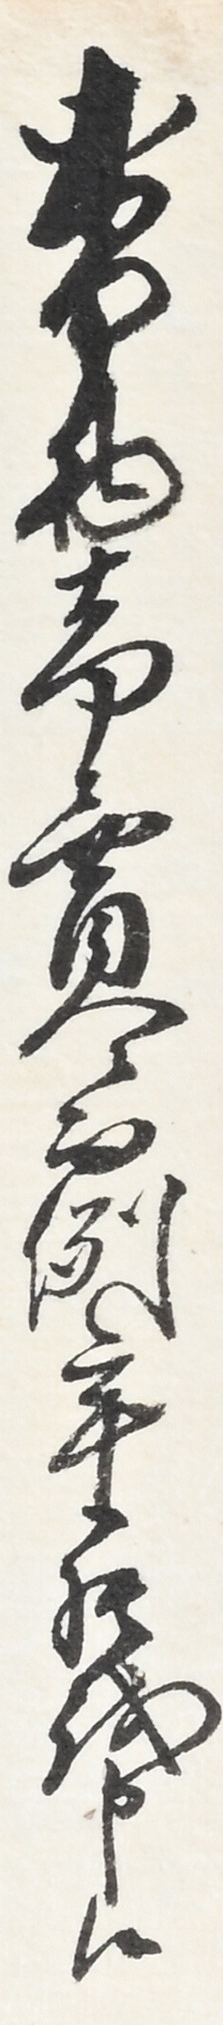小間物商売ニ而例年罷越申候
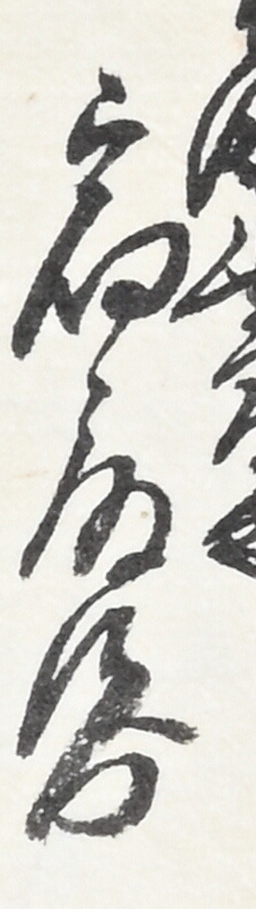宿藤左衛門
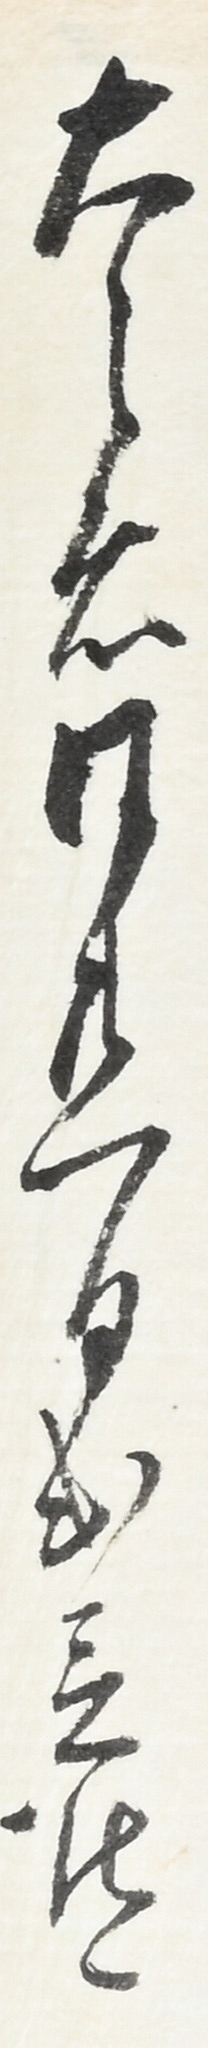右之者同廿一日出立仕候
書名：旅人泊控帳
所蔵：伊那市立高遠町図書館・合同会社AMANE
